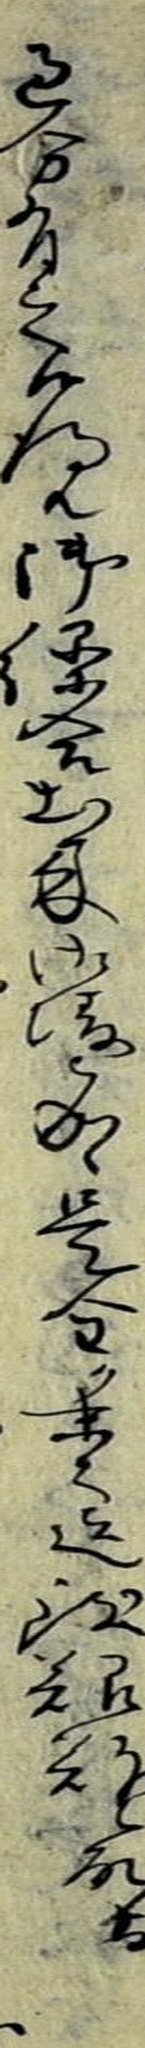過分有之候得共御繰合出来御凌被成候是全ク末々迄致艱難候故与
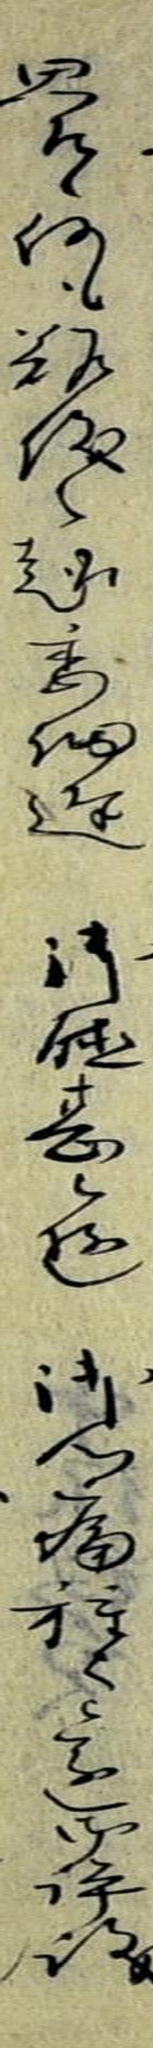思召候何も難儀之趣委細達御聴甚被遊御心痛種々被遂御評議
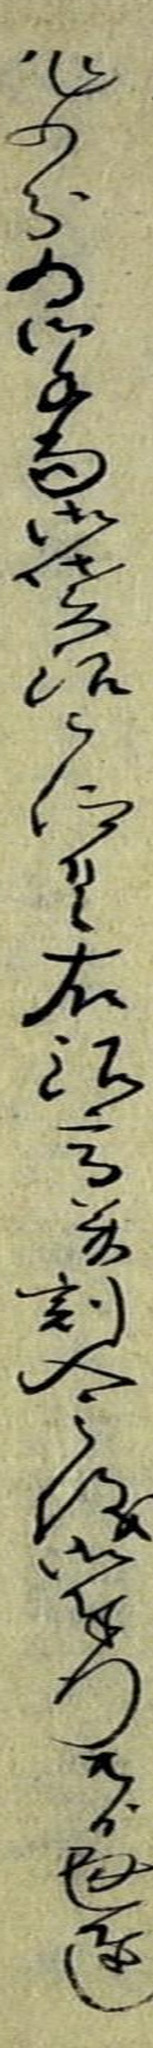乍少分為御手当御貸銀被仰付候右銀高并割合之儀御奉行共ゟ通達
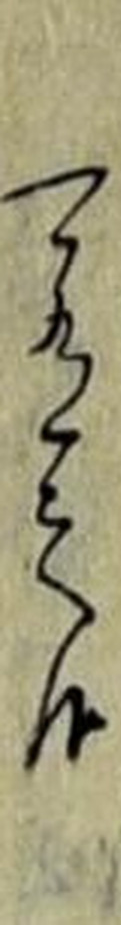可有之候
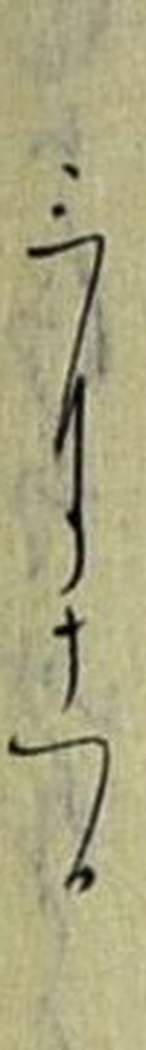三月十一日
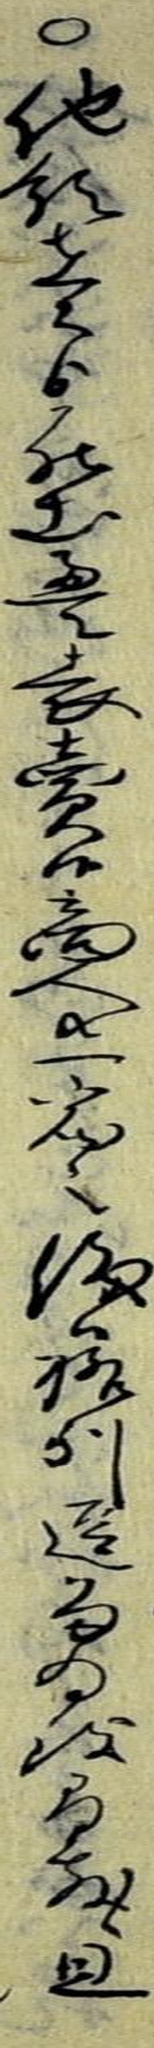〇他領在々ゟ罷出畳表売候商人共一宿之儀ハ格別逗留為致間敷候且
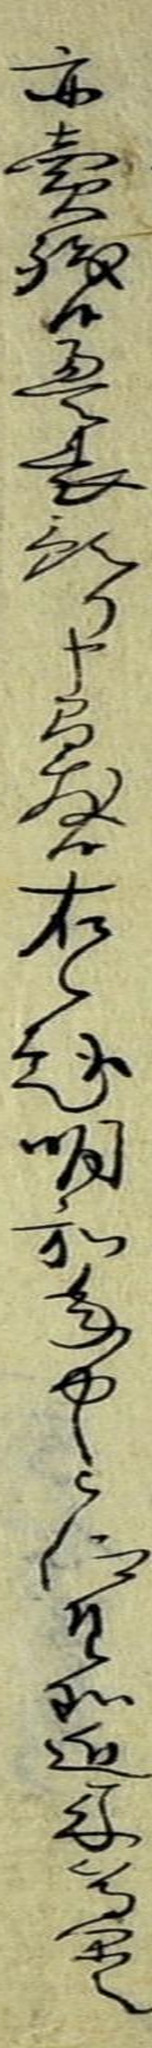亦売残候畳表預り申間敷候右之趣明和年中被仰付候処近来等閑之
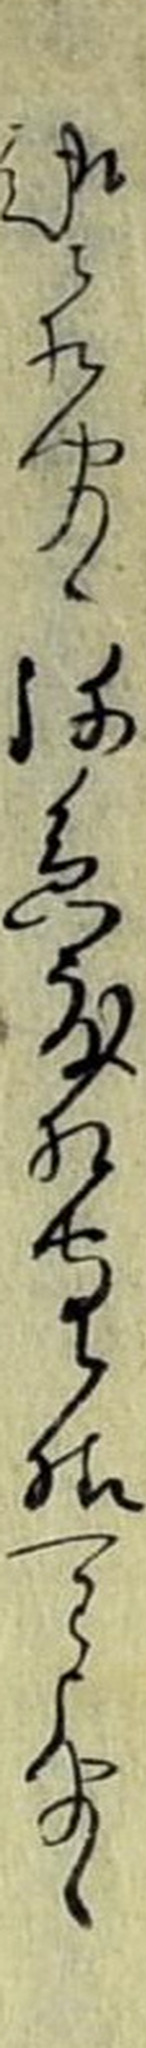趣ニ相聞候弥急度相守候様可被申聞候
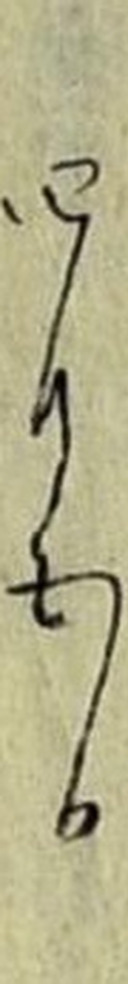四月五日
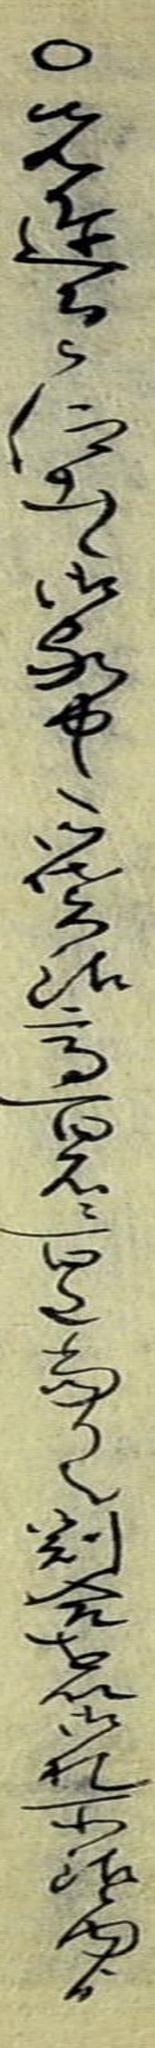〇先達而被仰出候御家中へ御貸銀高百石ニ百匁当り之割合を以御札所銀之内ゟ
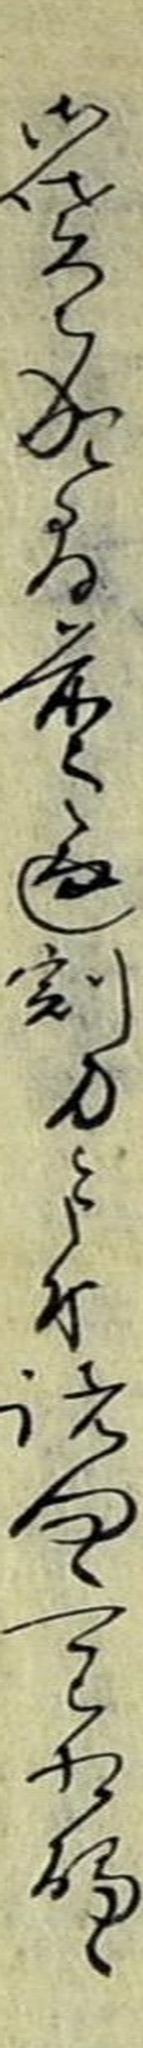御貸被成候間前々之通割方被申付諸向へ可被相触候
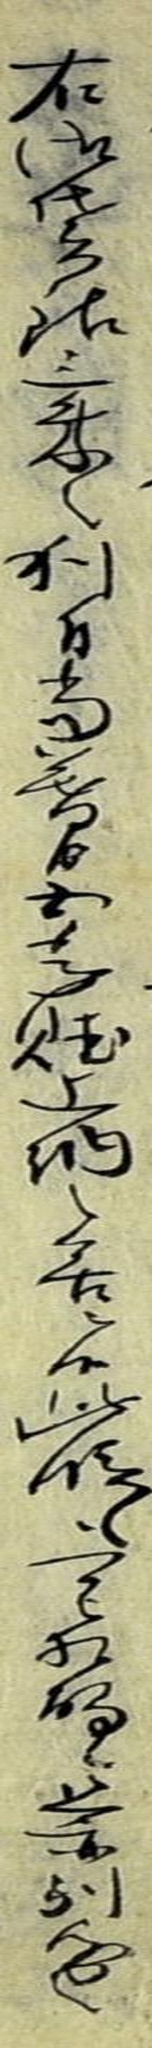右御貸銀三朱之利付当暮ゟ五年賦上納之筈ニ候此段も可被相触候且亦別紙之
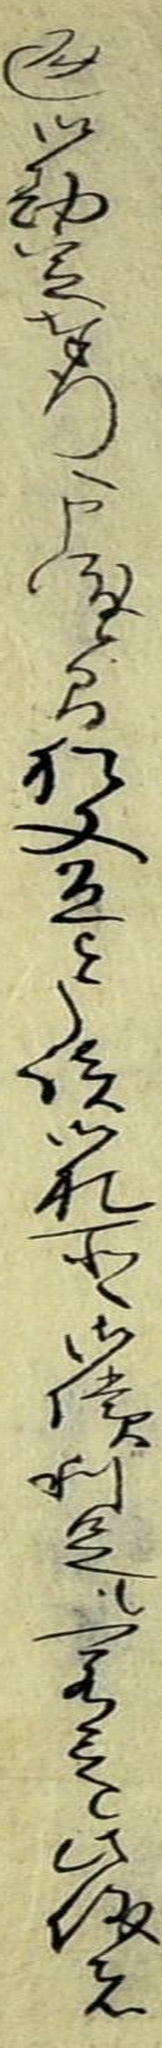通御勘定奉行へ申渡候間猶又宜被申談御札所へ御償利足も可有之候此儀者
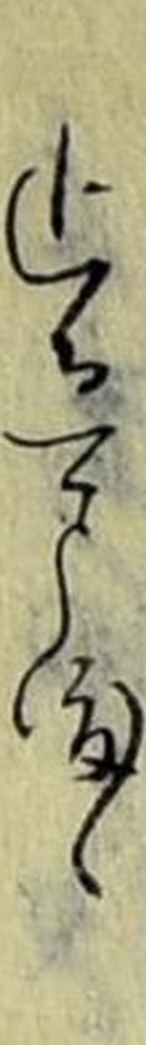追々可申渡候
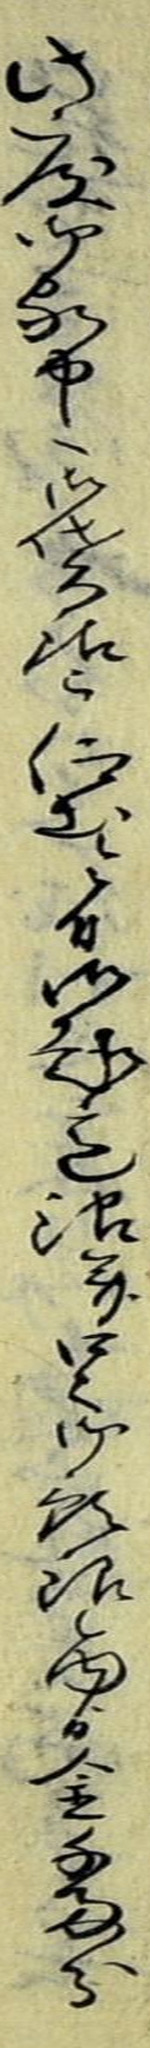此度御家中へ御貸銀被仰出候ニ付御趣意銀并口々御預銀之内ゟ金千両分

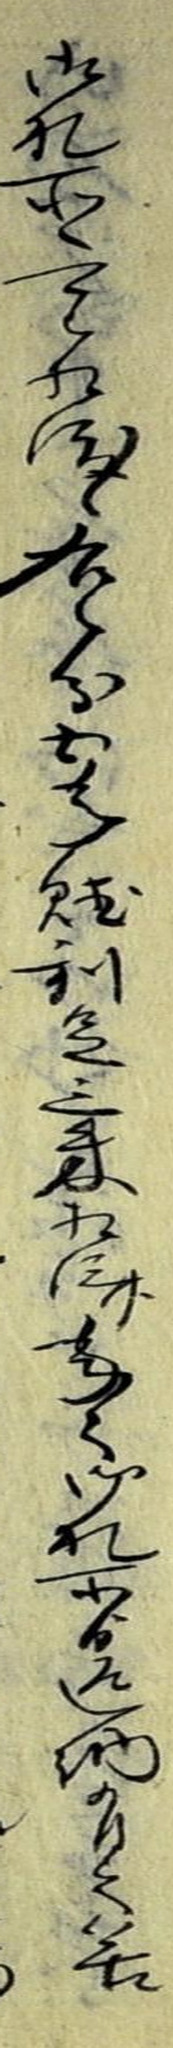御札所へ可被相渡候右之分五年賦利足三朱相済年々御札所ゟ返納有之筈
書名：命令之部 三
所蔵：福井県文書館 Fukui Prefectural Archives
